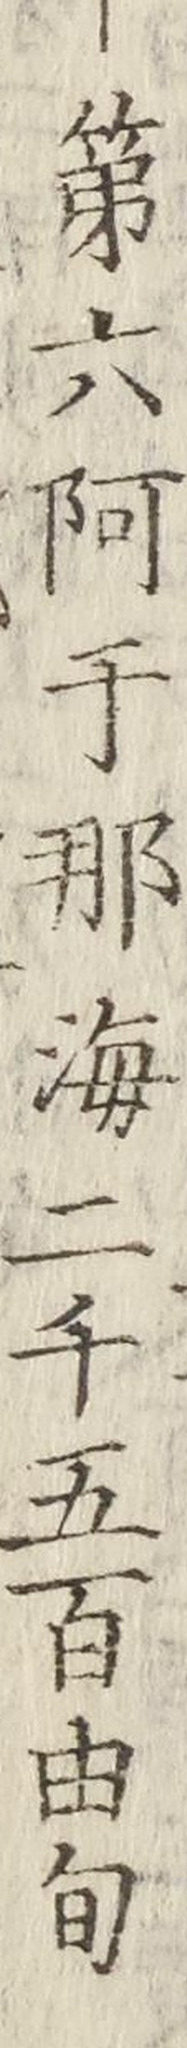第六阿干那海二千五百由旬
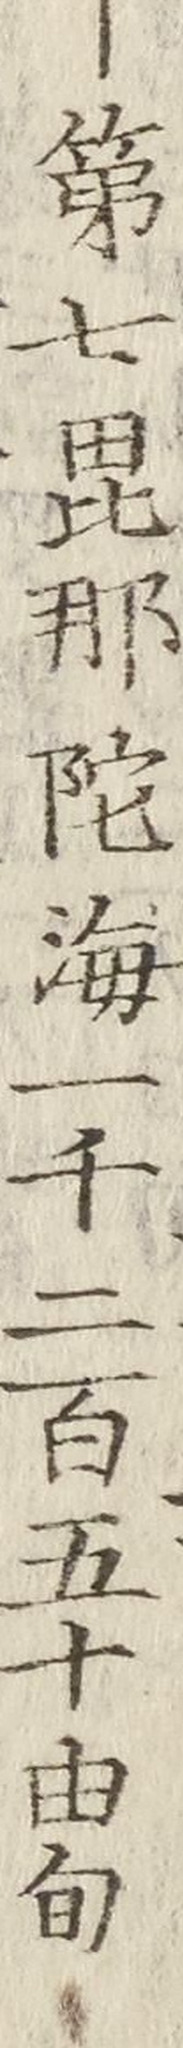第七毘那陀海一千二百五十由旬
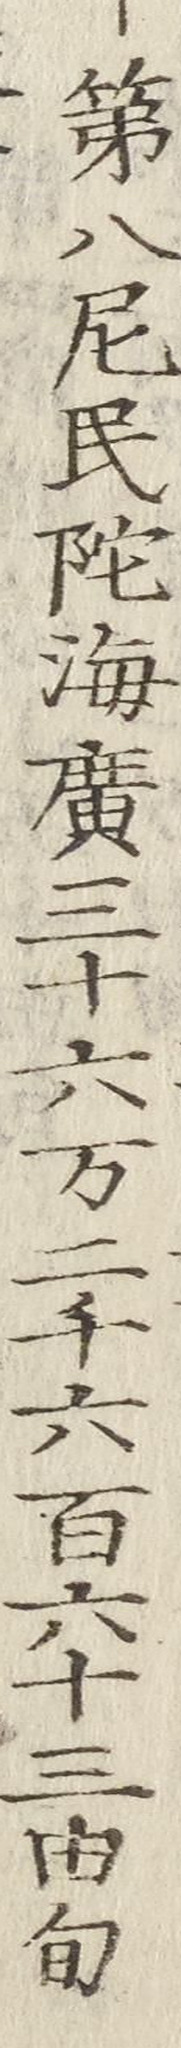第八尼民陀海広三十六万二千六百六十三由旬
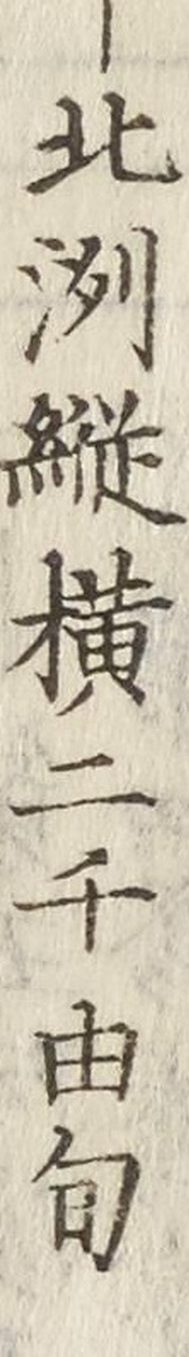北洲縦横二千由旬
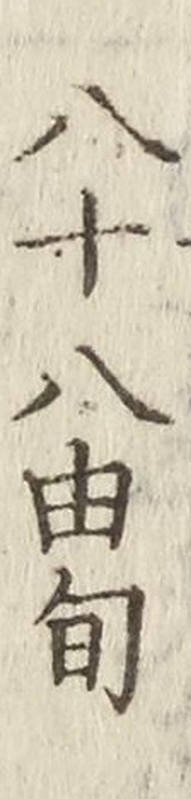八十八由旬
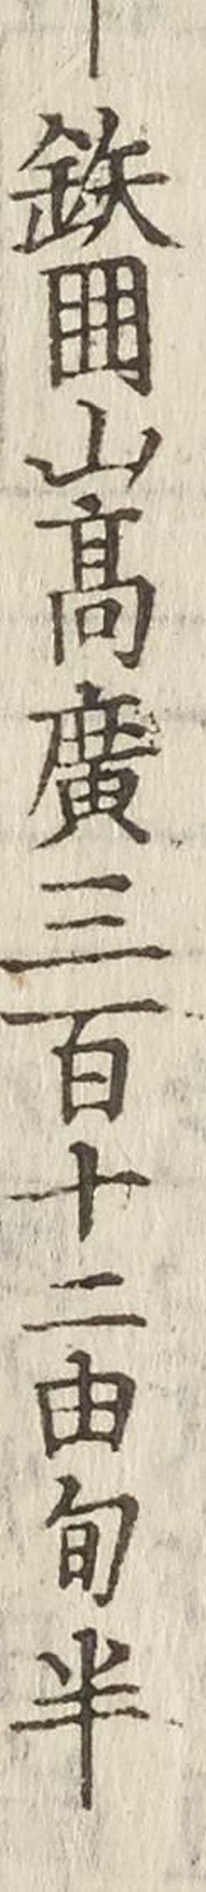鉄囲山高広三百十二由旬半
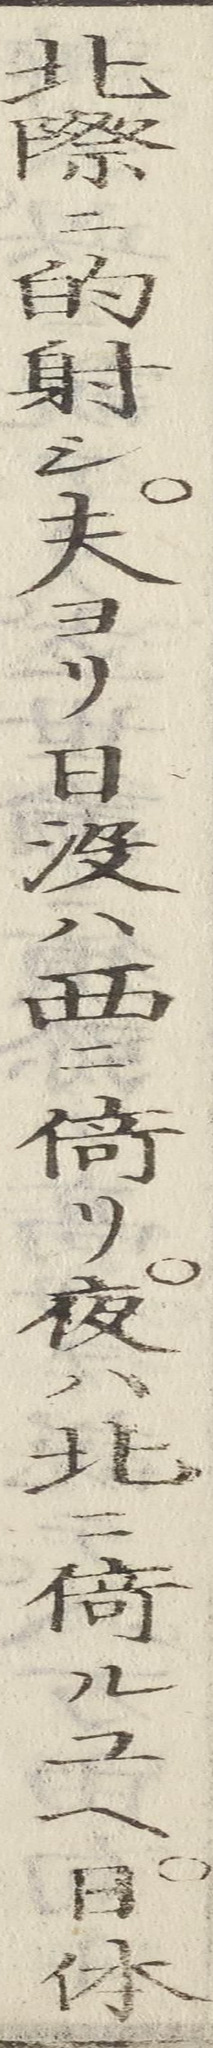北際ニ的射シ。夫ヨリ日没ハ西ニ倚リ。夜ハ北ニ倚ルユヘ。日体
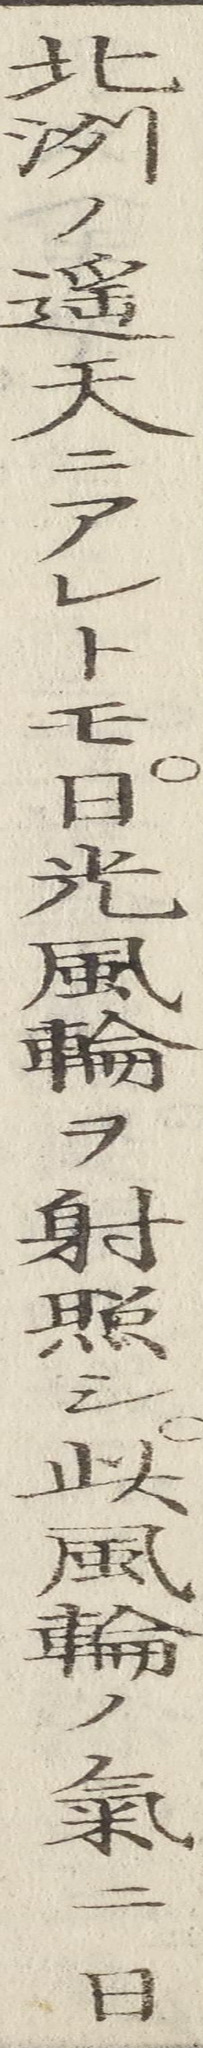北洲ノ遥天ニアレトモ。日光風輪ヲ射照シ。此風輪ノ気ニ日
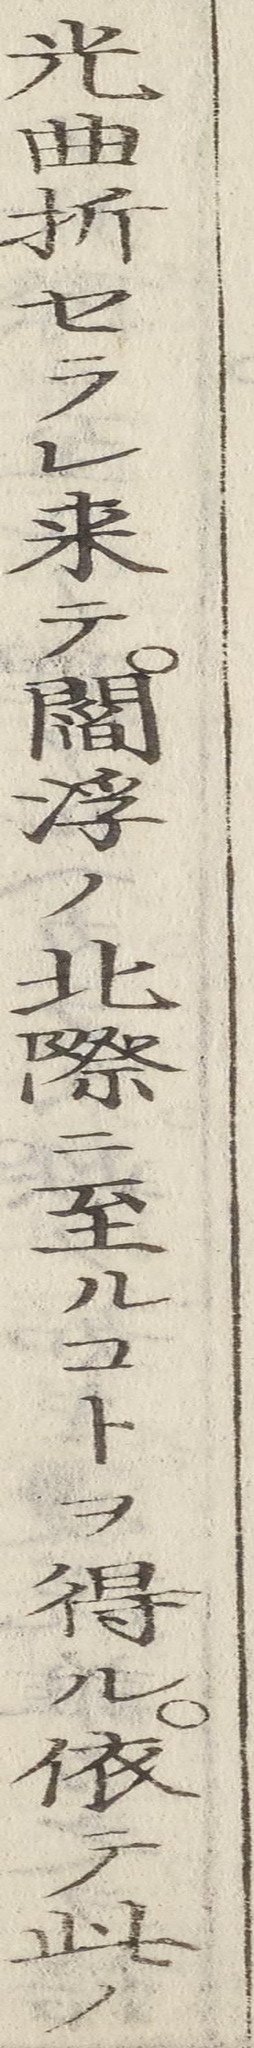光曲折セラレ来テ。閻浮ノ北際ニ至ルコトヲ得ル。依テ此ノ
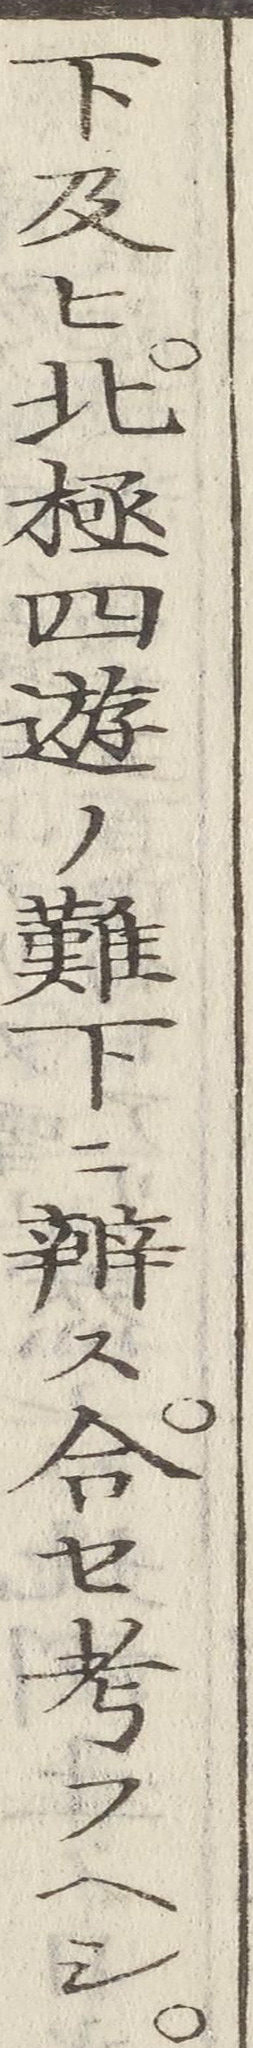下及ヒ。北極四游ノ難下ニ弁ス。合セ考フヘシ。
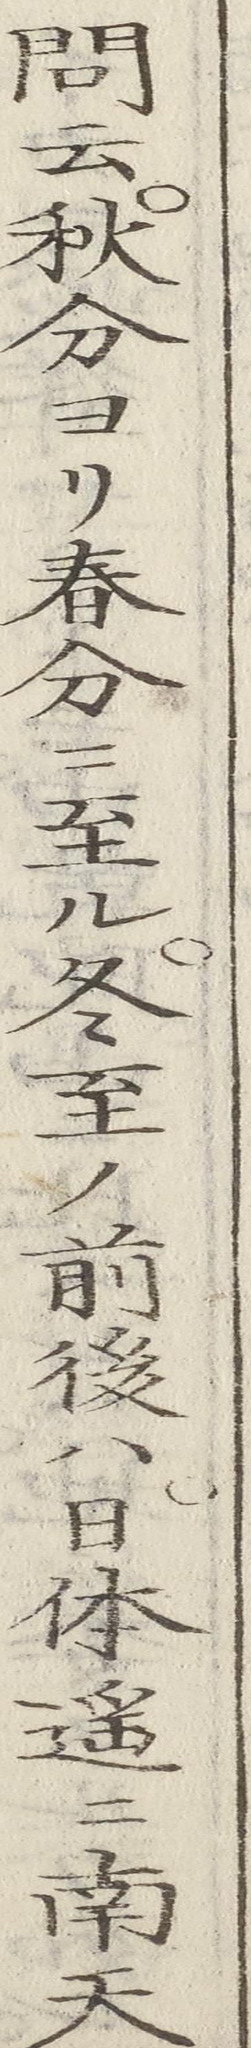問云。秋分ヨリ春分ニ至ル。冬至ノ前後ハ。日体遥ニ南天
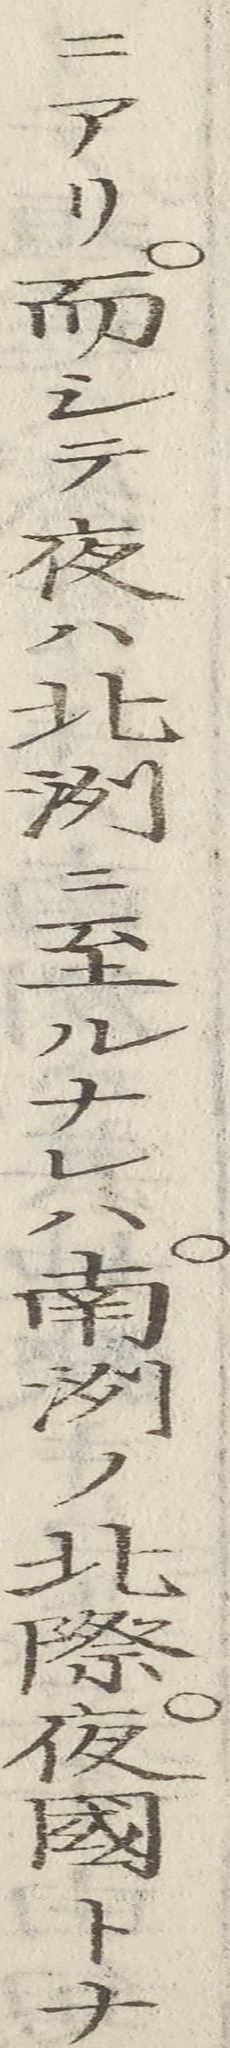ニアリ。而シテ夜ハ北洲ニ至ルナレハ。南洲ノ北際。夜国トナ
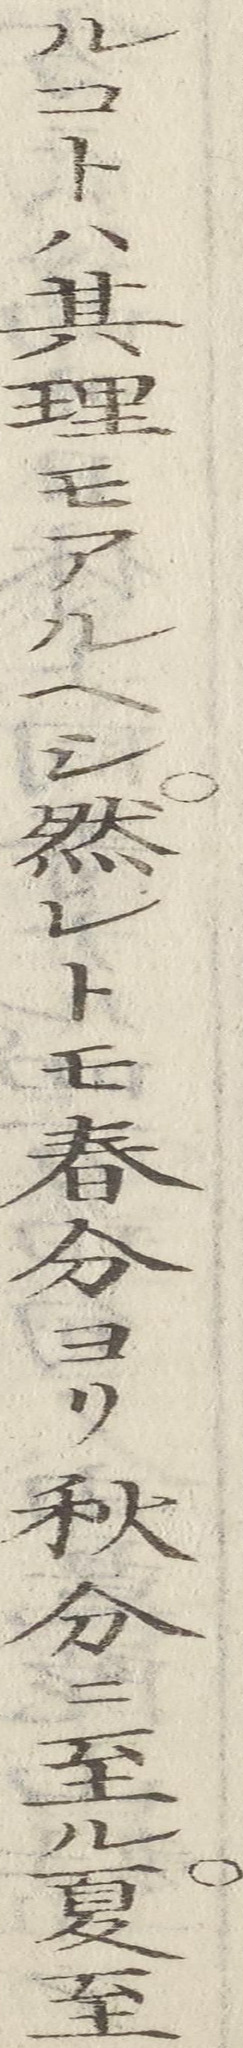ルコトハ其理モアルヘシ。然レトモ春分ヨリ秋分ニ至ル。夏至
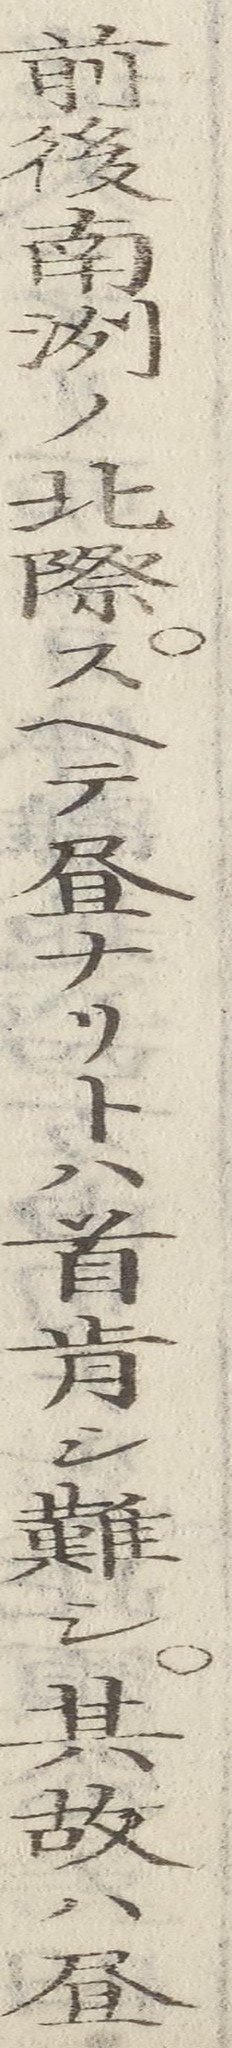前後南洲ノ北際。スヘテ昼ナリトハ首肯シ難シ。其故ハ昼
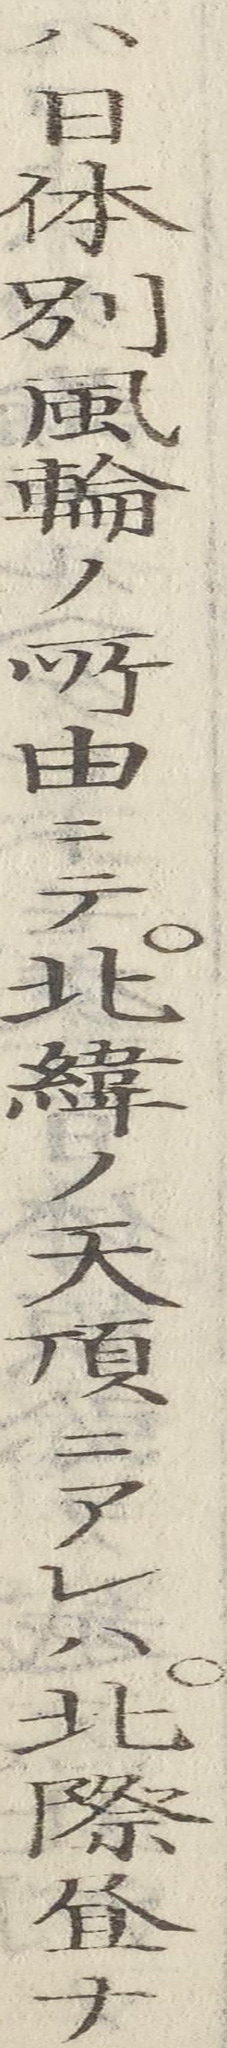ハ日体別風輪ノ所由ニテ。北緯ノ天頂ニアレハ。北際昼ナ

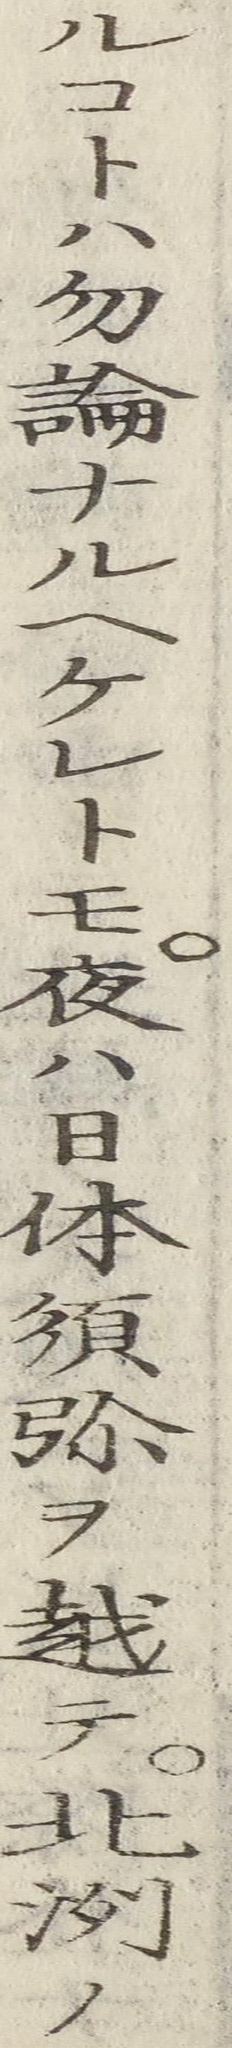ルコトハ勿論ナルヘケレトモ。夜ハ日体須弥ヲ越テ。北洲ノ
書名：護法新論　二編　上
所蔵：東京大学地震研究所図書室 Earthquake Research Institute Library, The University of Tokyo, JAPAN
